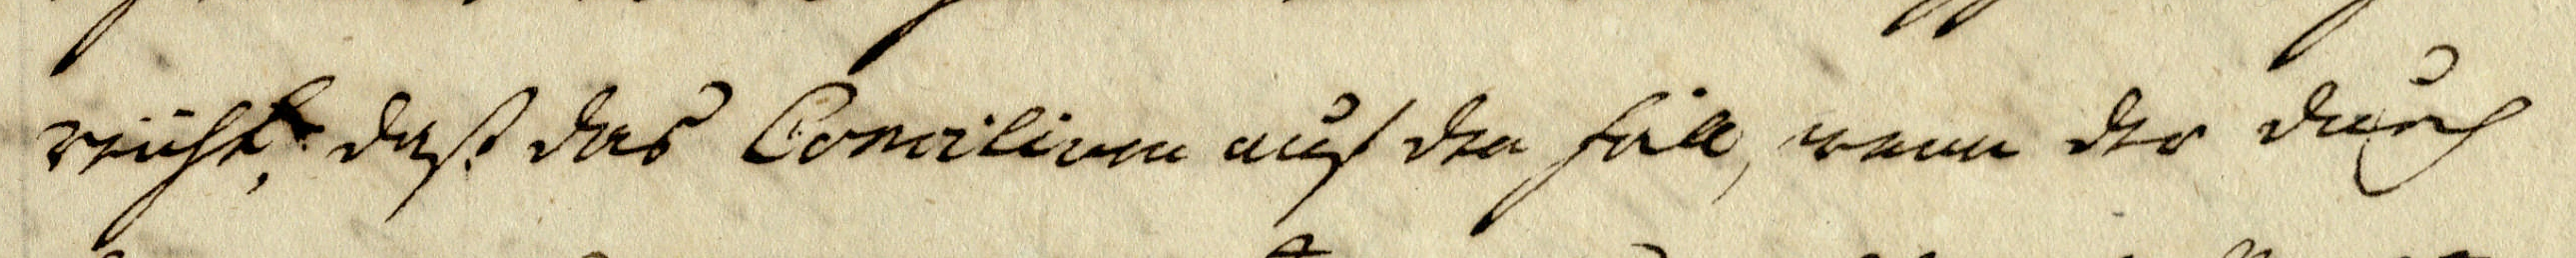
reicht, daß das Concilium auf den Fall, wenn der durch
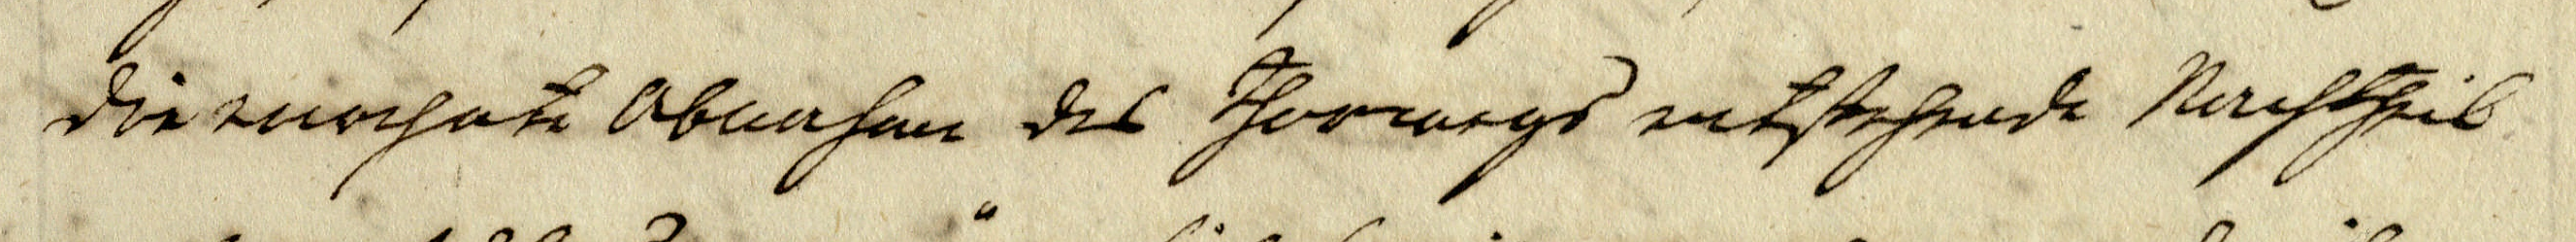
die erwehnte Abnahme des Thorwegs entstehende Nachtheil
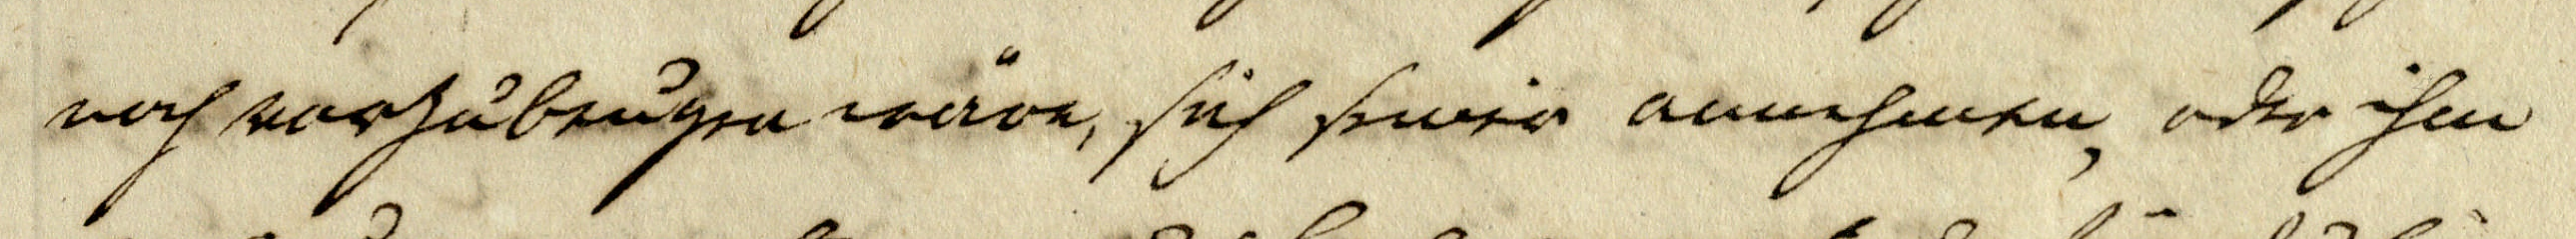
noch vorzubeugen wäre, sich seiner annehmen, oder ihm
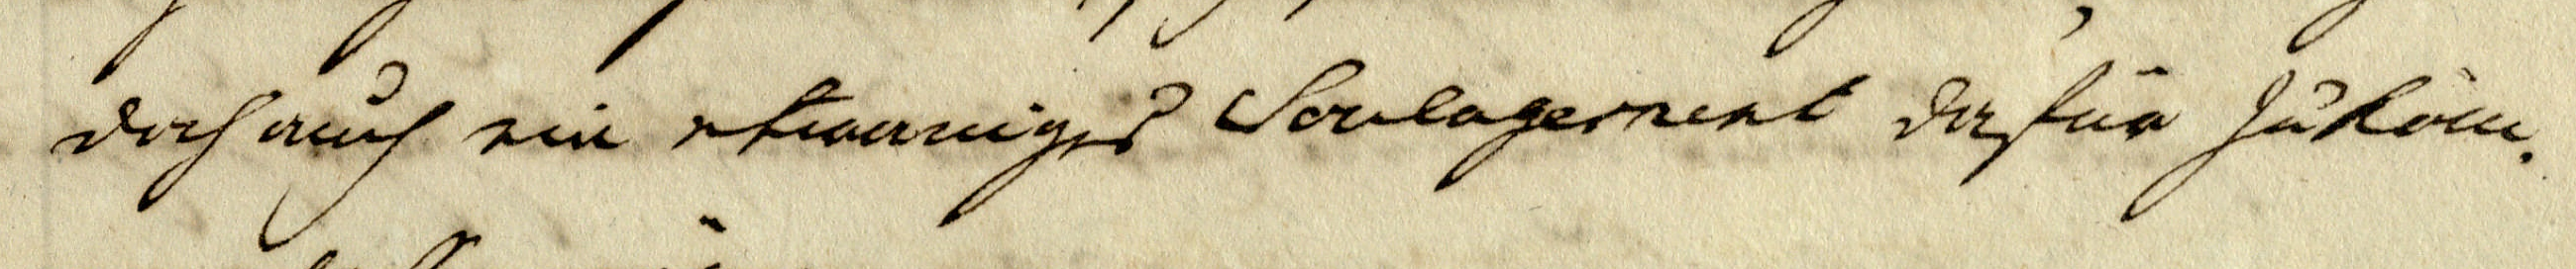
doch auch ein etwaniges Soulagement dafür zukom¬
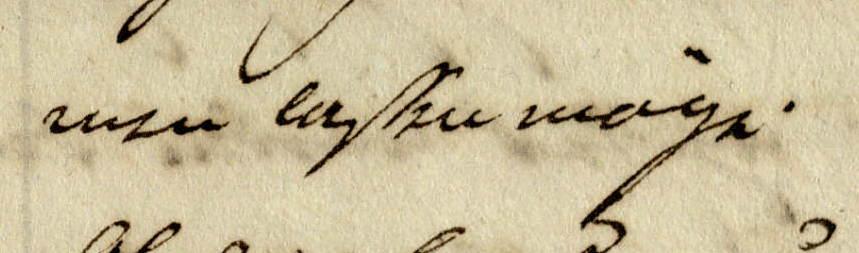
men lassen möge.
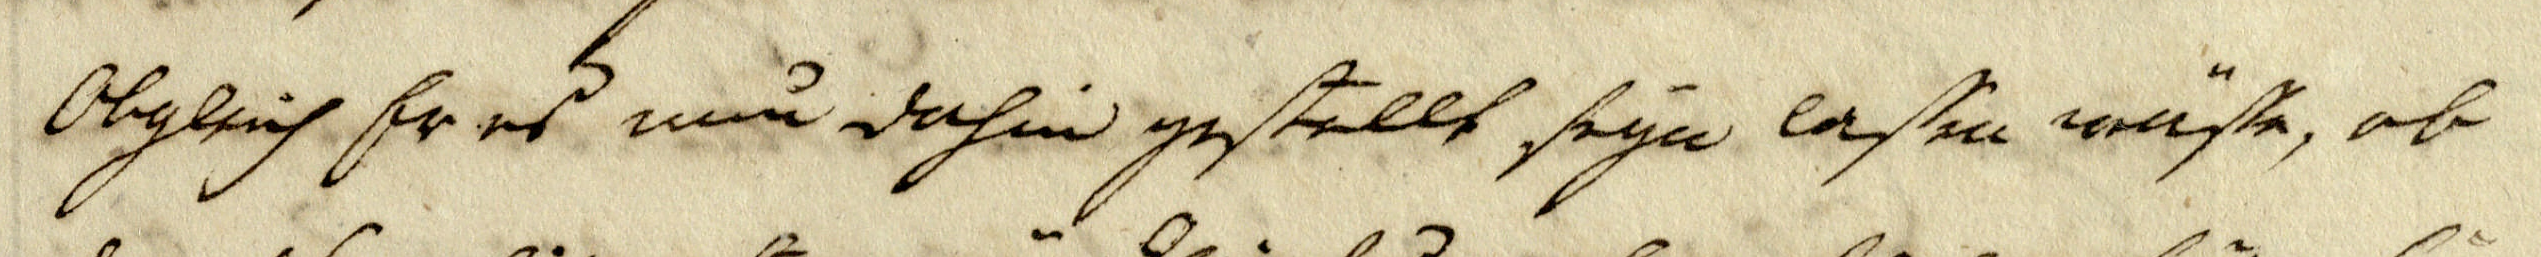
Obgleich Er es nun dahin gestellt seÿn lassen müsse, ob
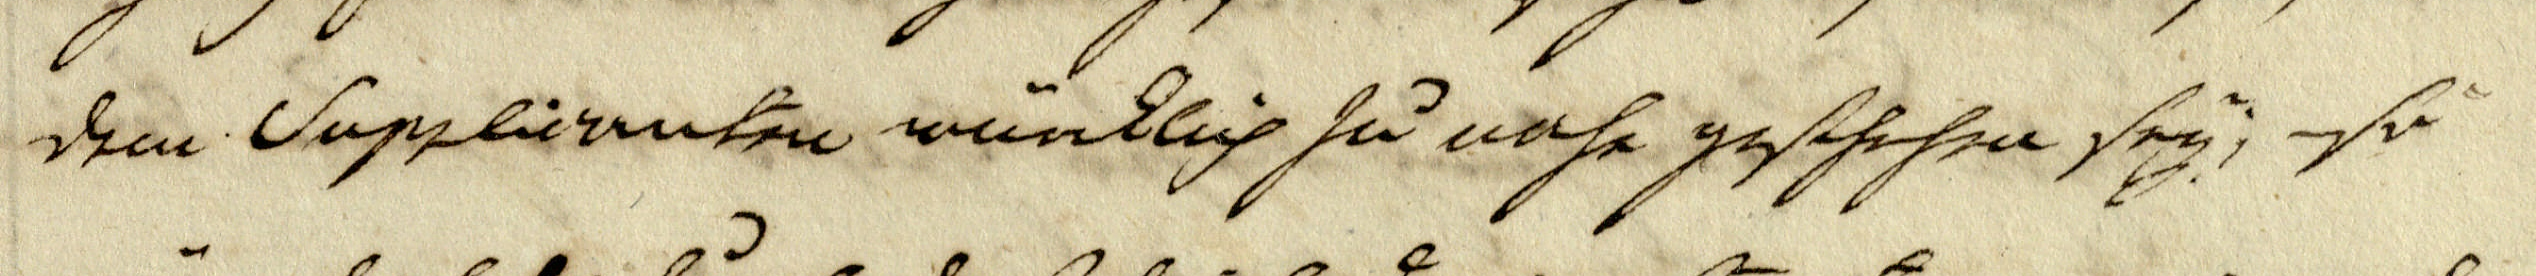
dem Supplicanten würcklich zu nahe geschehen seÿ, so
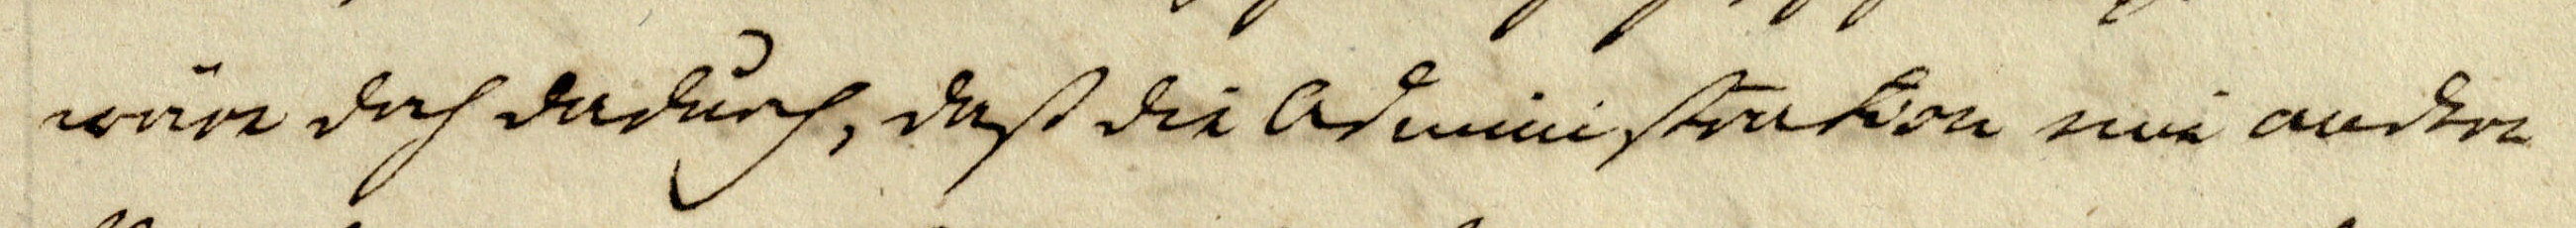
wäre doch dadurch, daß die Administration eine andere
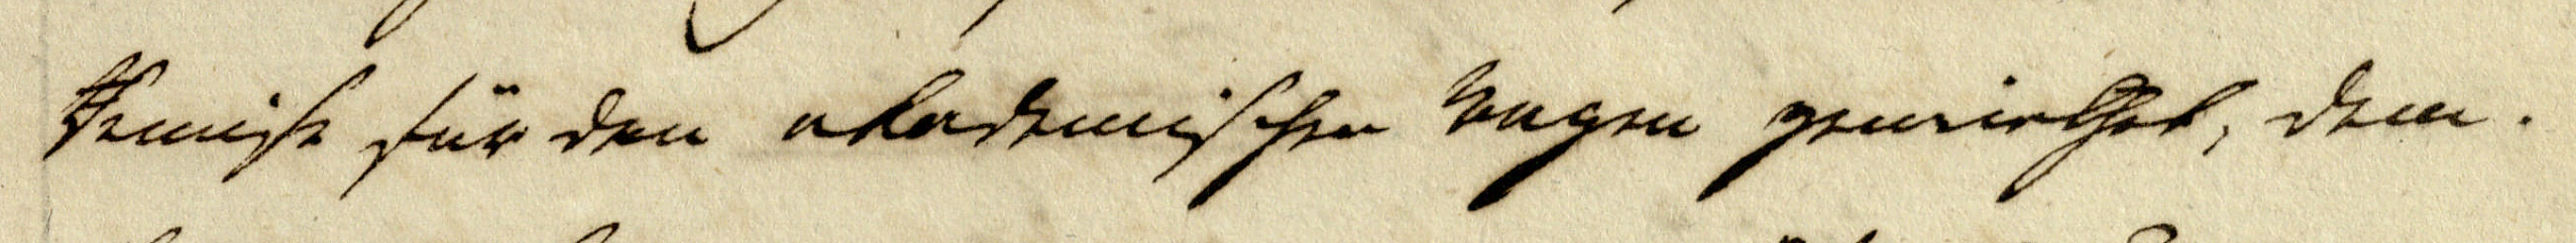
Remise für den akademischen Wagen gemiethet, dem¬
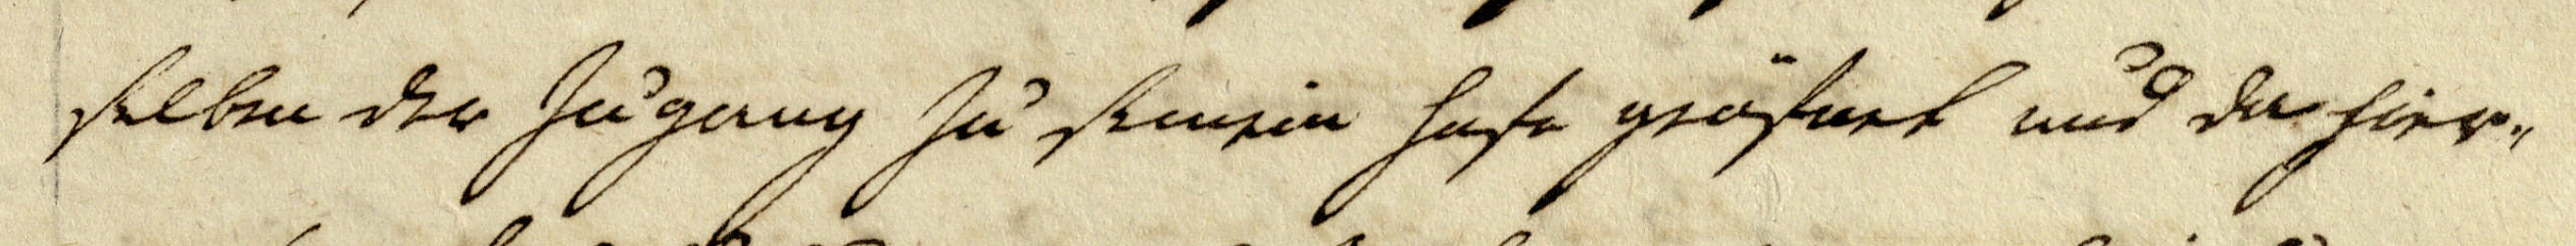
selben der Zugang zu seinem Hofe geöffnet und da hier¬
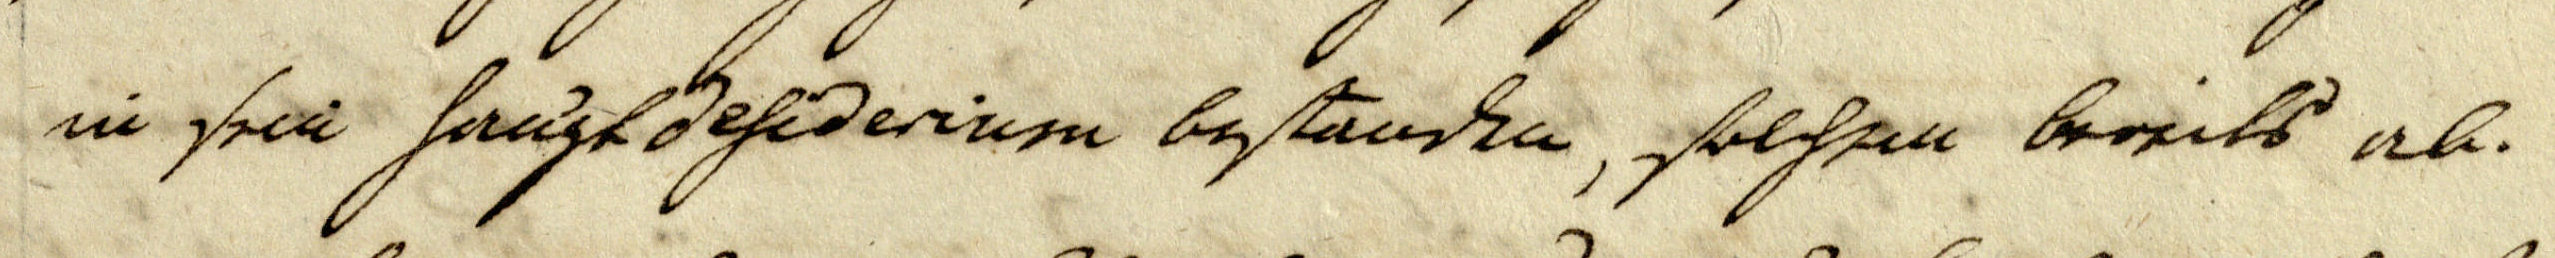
in sein Hauptdesiderium bestanden, solchem bereits ab¬
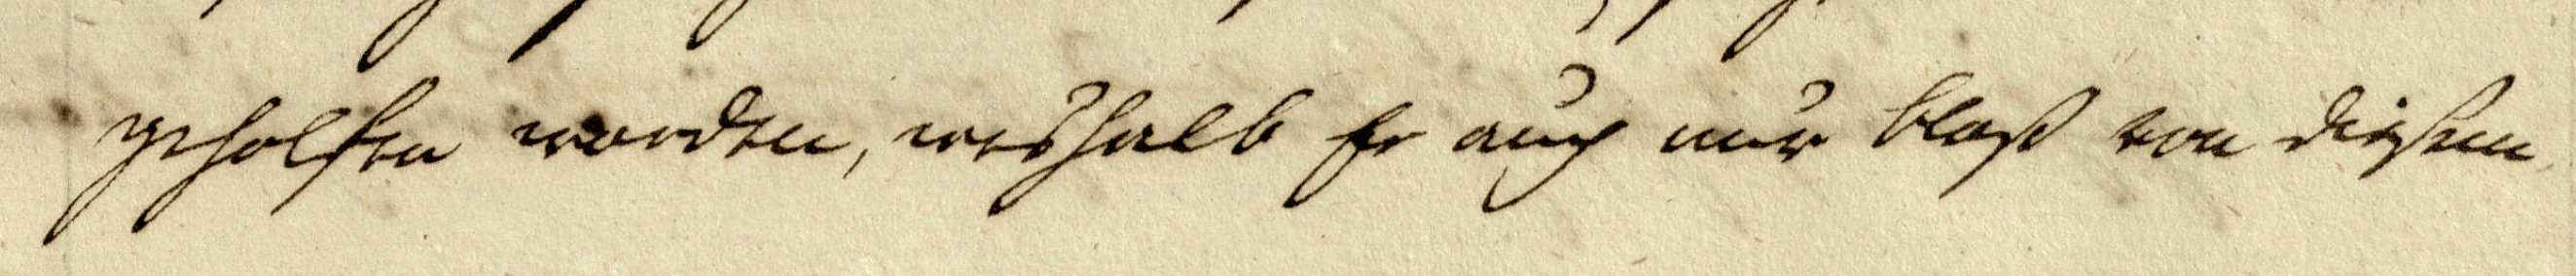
geholfen worden, weshalb Er auch nur bloß von diesem
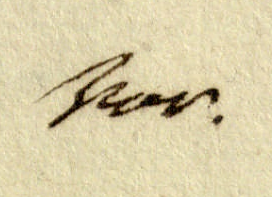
Vor¬
